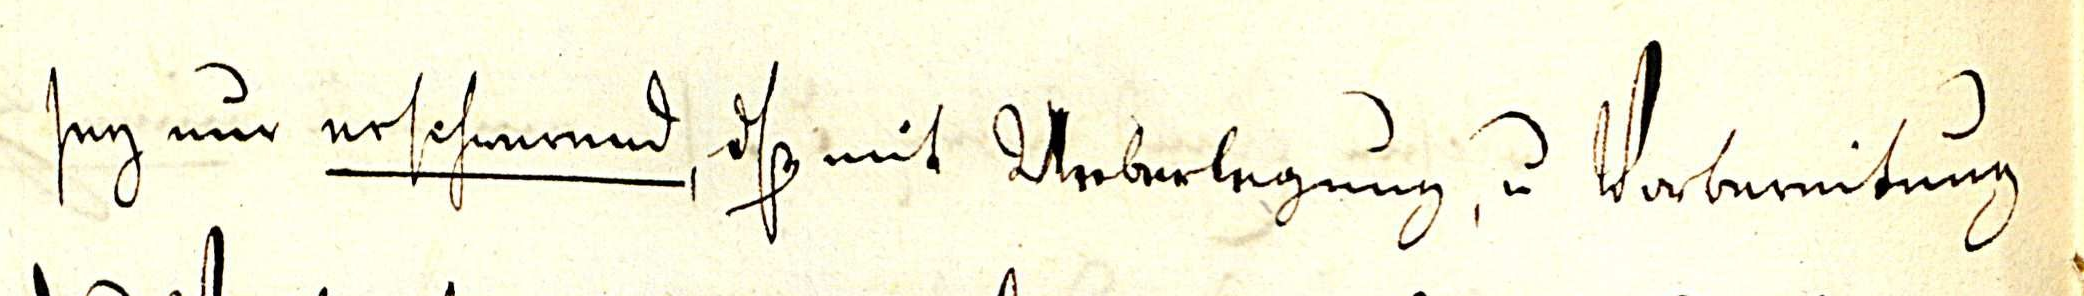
sey nur erschwerend, daß mit Ueberlegung, u Vorbereitung
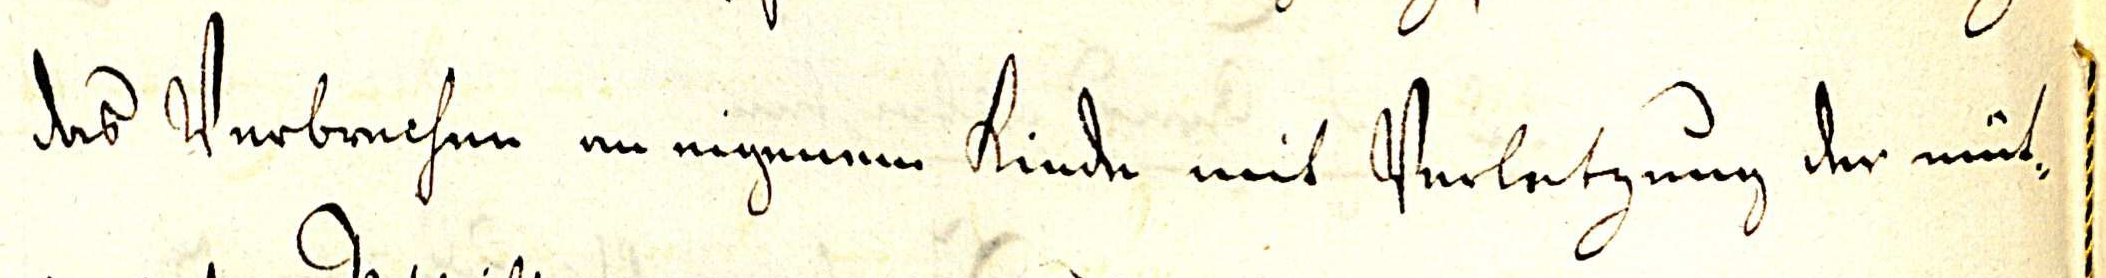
das Verbrechen an eigenen Kinde mit Verletzung der müt¬
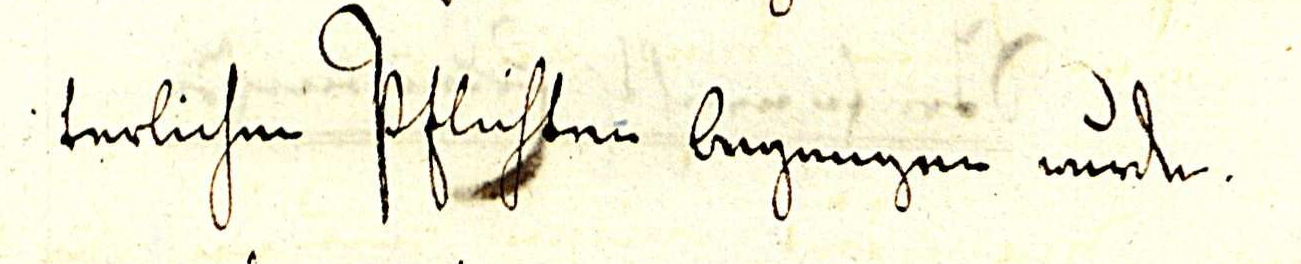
terlichen Pflichten begangen wurde.
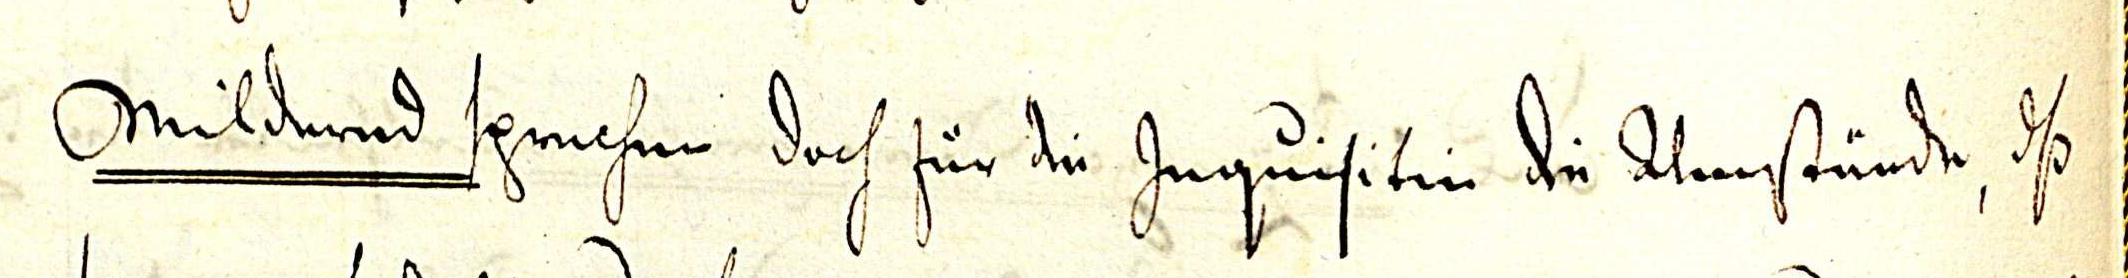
Mildernd sprechen doch für die Inquisitin die Umstände, daß
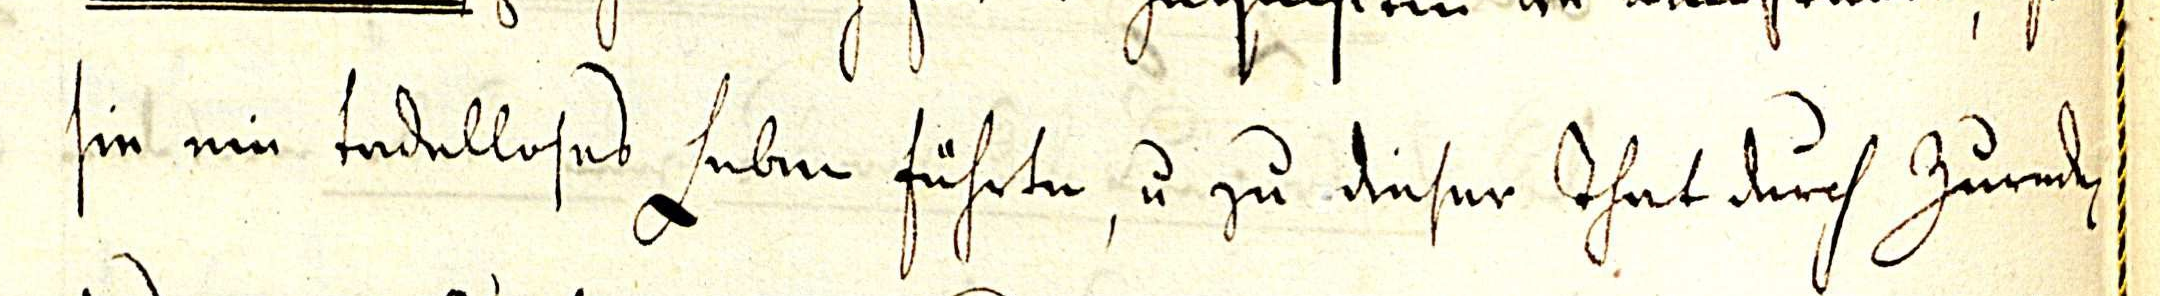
sie ein tadelloses Leben führte, u zu dieser That durch Zurede
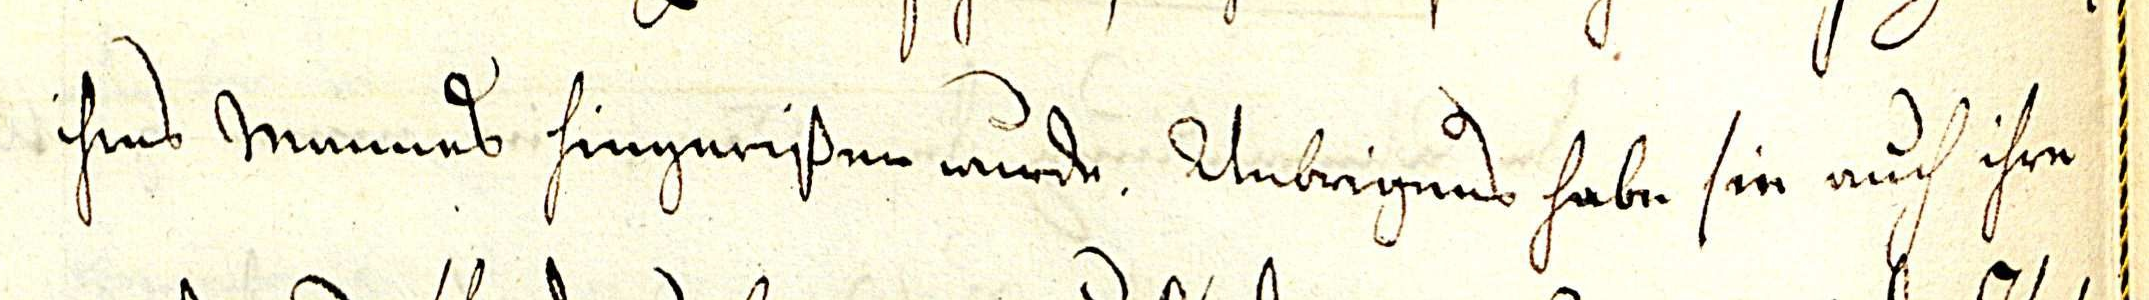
ihres Mannes hingerißen wurde. Uebrigens habe sie auch ihre
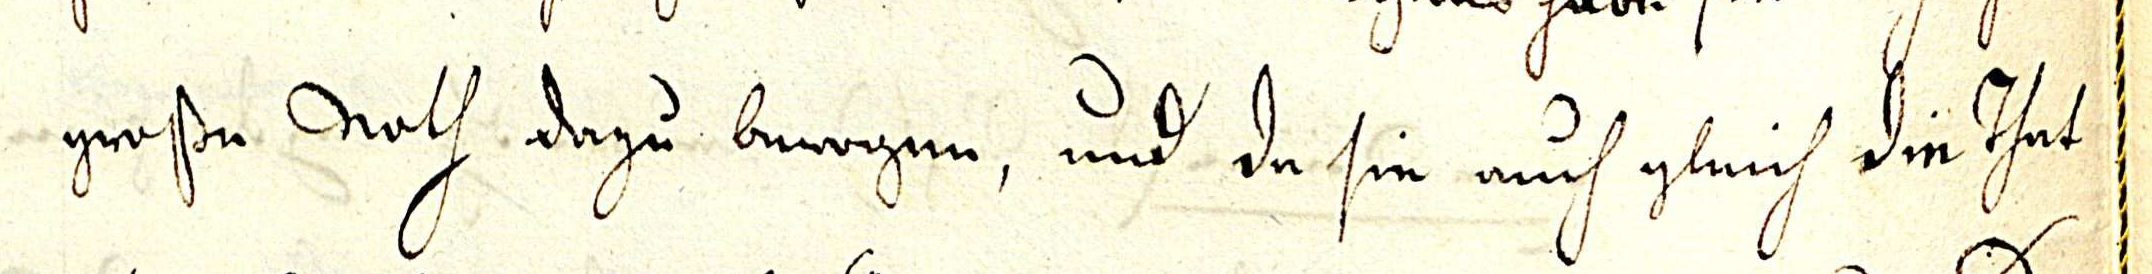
große Noth dazu bewogen, und da sie auch gleich die That
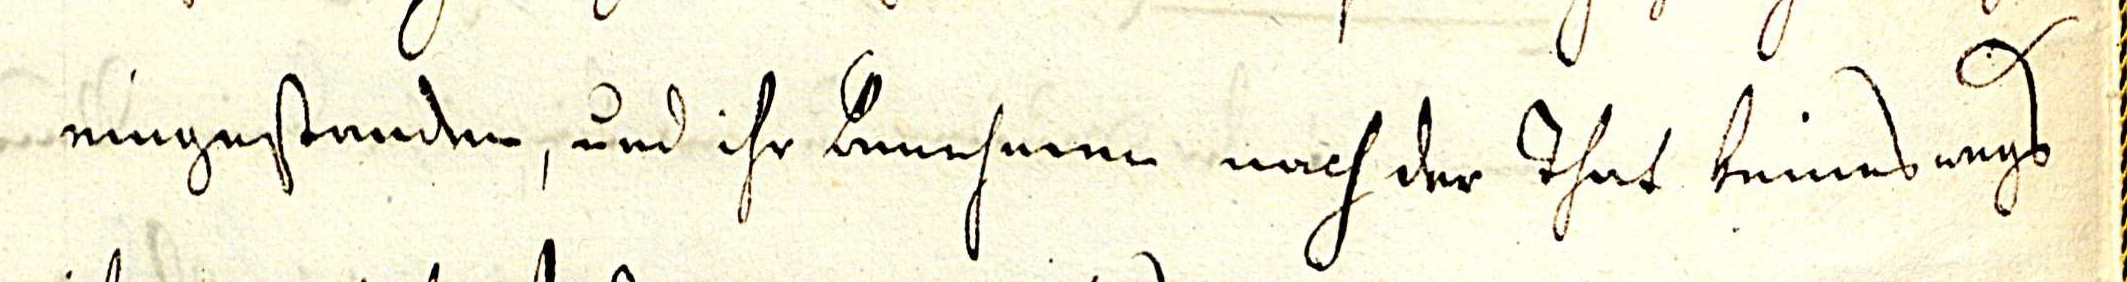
eingestanden, und ihr Benehmen nach der That keines wegs
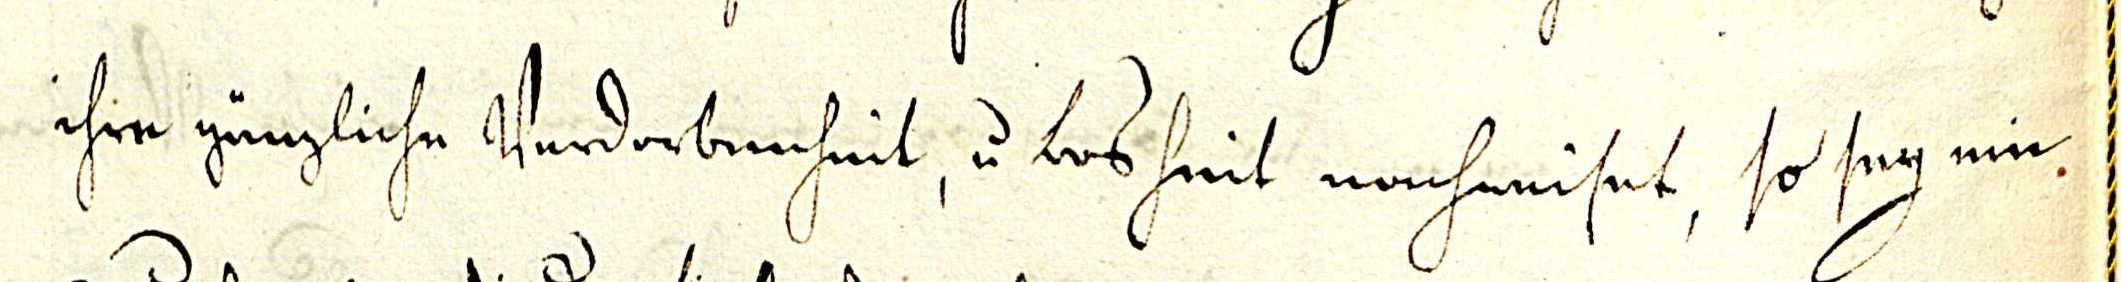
ihre gänzliche Verdorbenheit, u Bosheit nachweiset, so sey ein
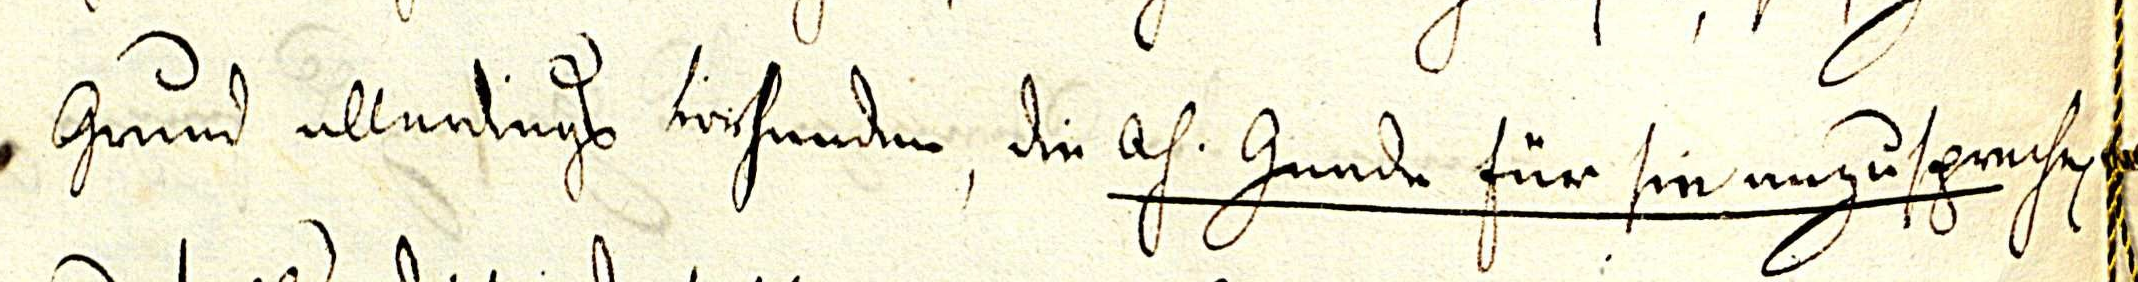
Grund allentags vorhanden, die Ah. Gnade für sie anzusprechen
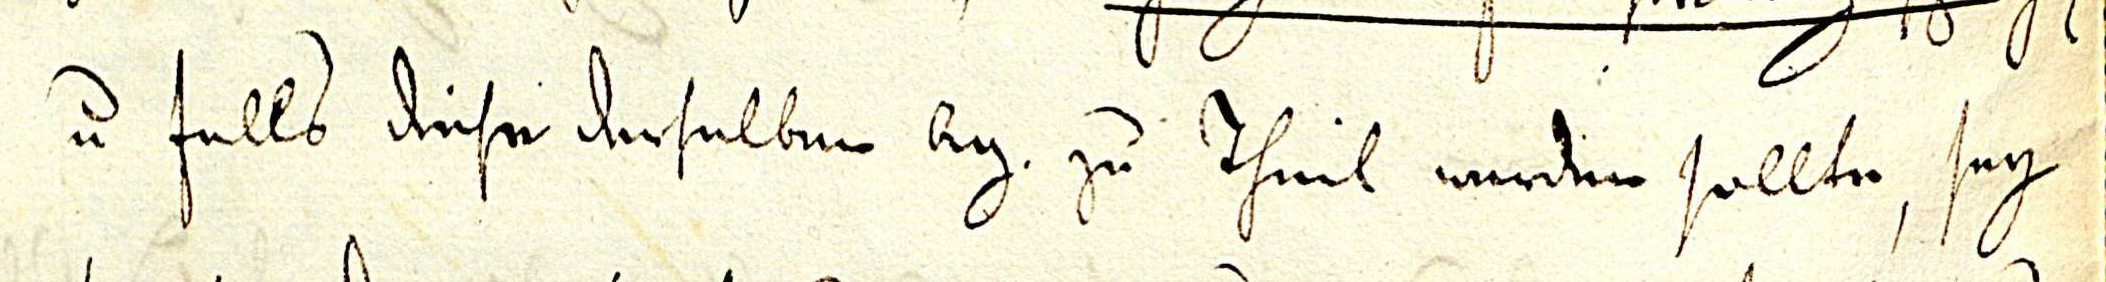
u falls diese derselben Ag. zu Theil werden sollte, sey
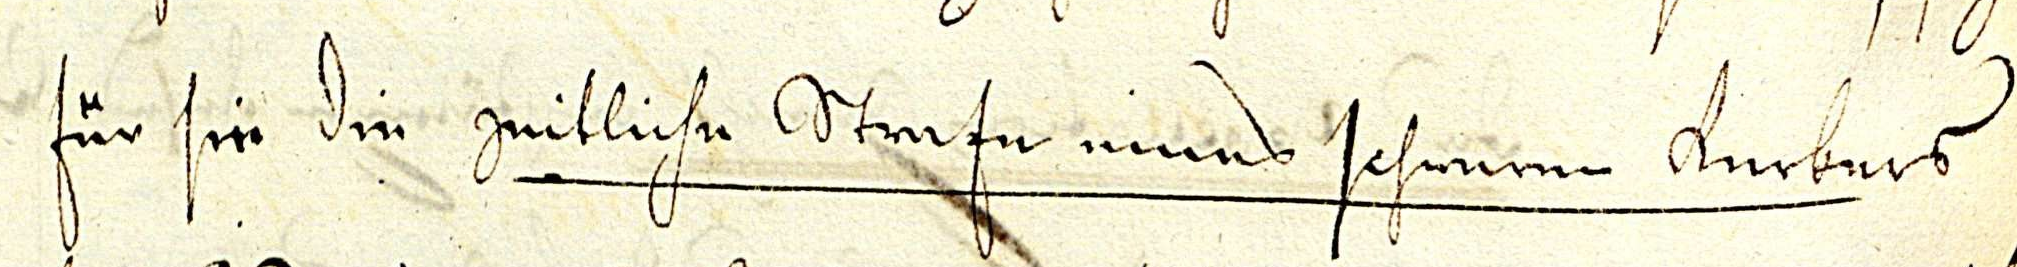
für sie die zeitliche Strafe eines schweren Kerkers
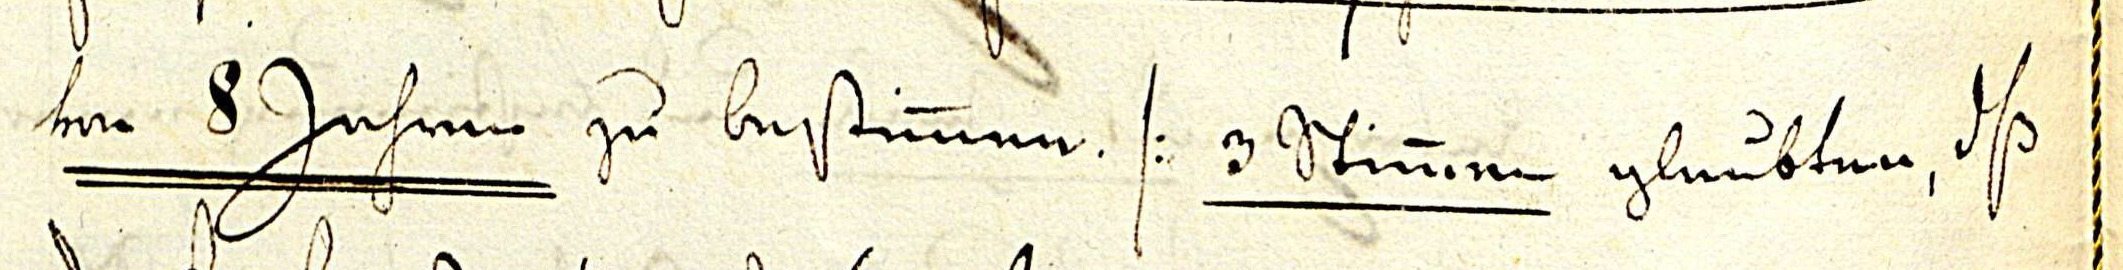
von 8 Jahren zu bestimmen (3 Stimmen glaubten, daß
